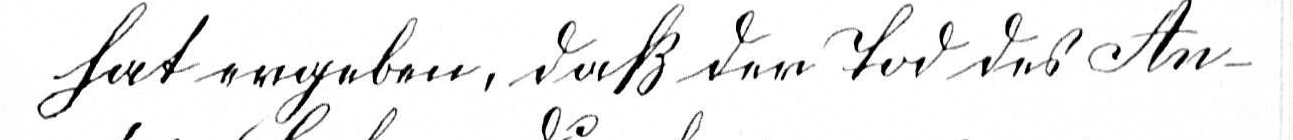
hat ergeben daß der Tod des An¬
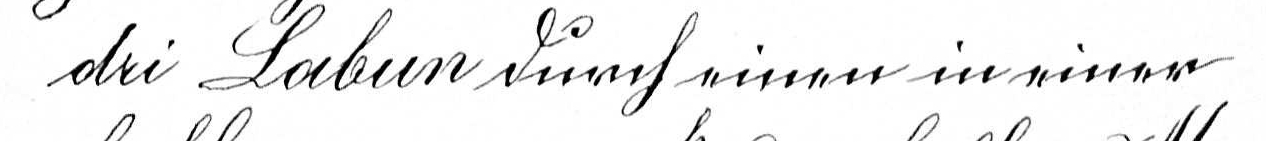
dri Labun durch einen in einer
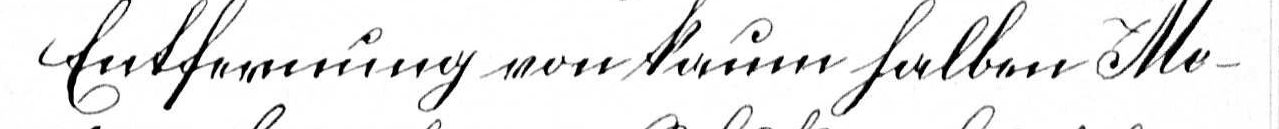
Entfernung von kaum halben Mo¬
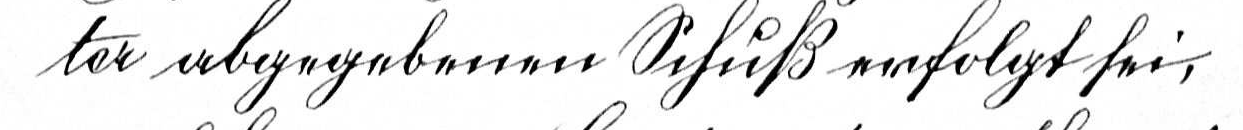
ter abgegebenen Schuß erfolgt sei,
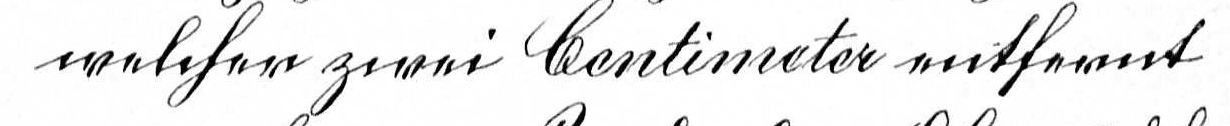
welcher zwei Centimeter entfernt
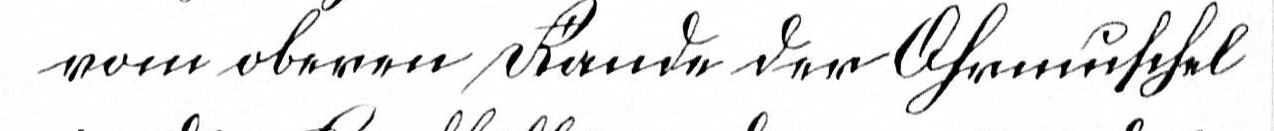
vom oberen Rande der Ohrmuschel
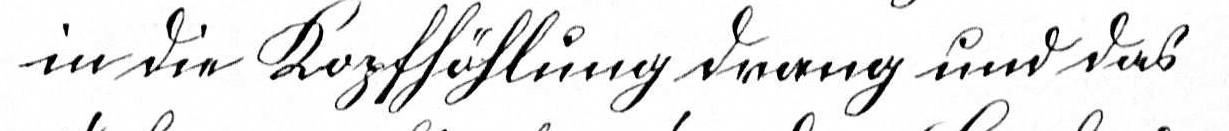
in die Kopfhöhlung drang und das
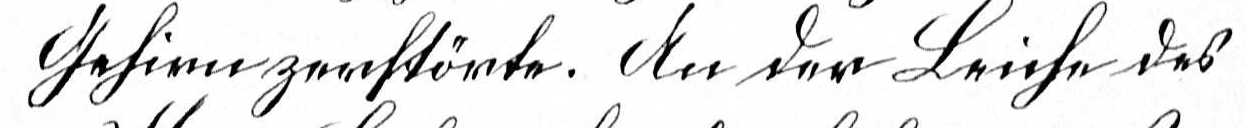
Gehirn zerstörte. An der Leiche des
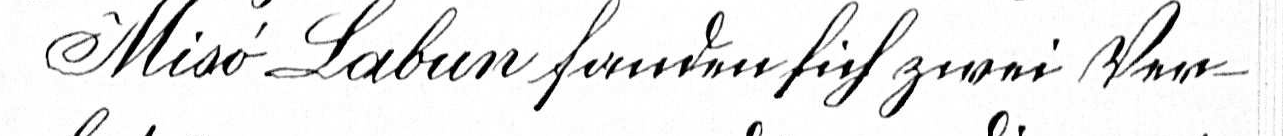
Misó Labun fanden sich zwei er¬
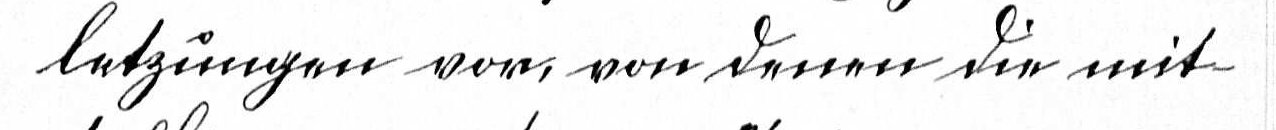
letzungen vor, von denen die mit¬
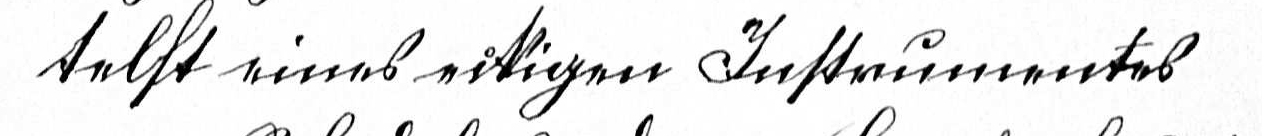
telst eines eckigen Instrumentes
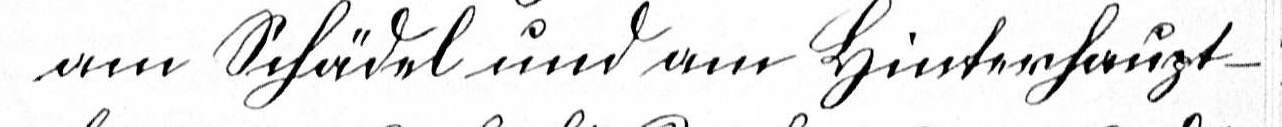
am Schädel und am Hinterhaupt¬
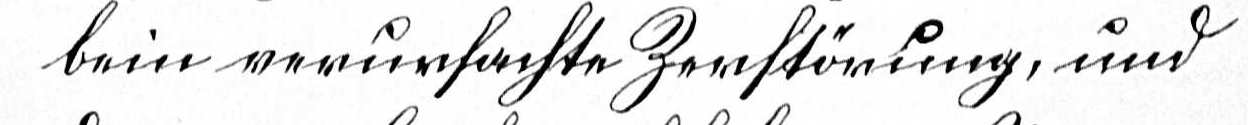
bein verursachte Zerstörung, und
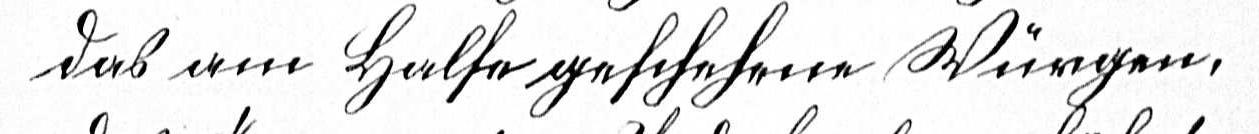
das am Halfe geschehene Würgen,
